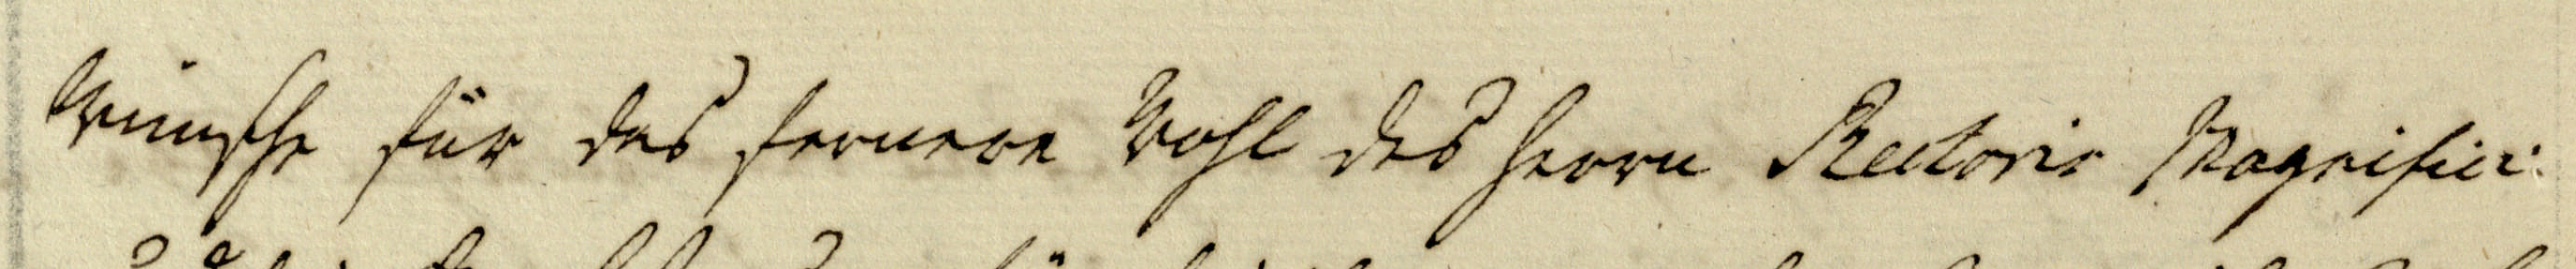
Wünsche für des fernere Wohl des Herrn Rectoris Magnifici
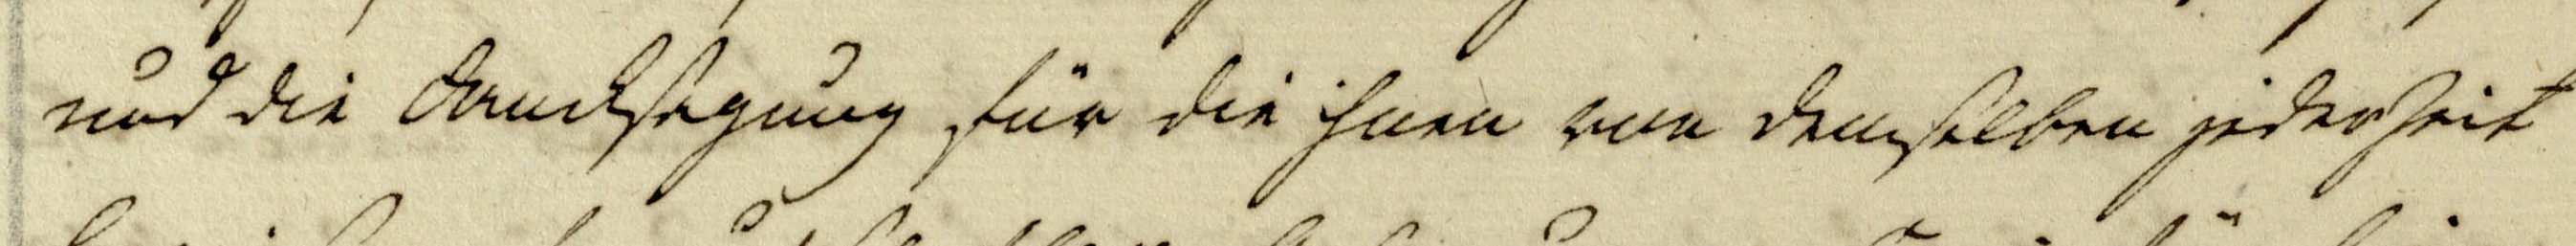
und die Dancksagung für die ihnen von demselben jederzeit
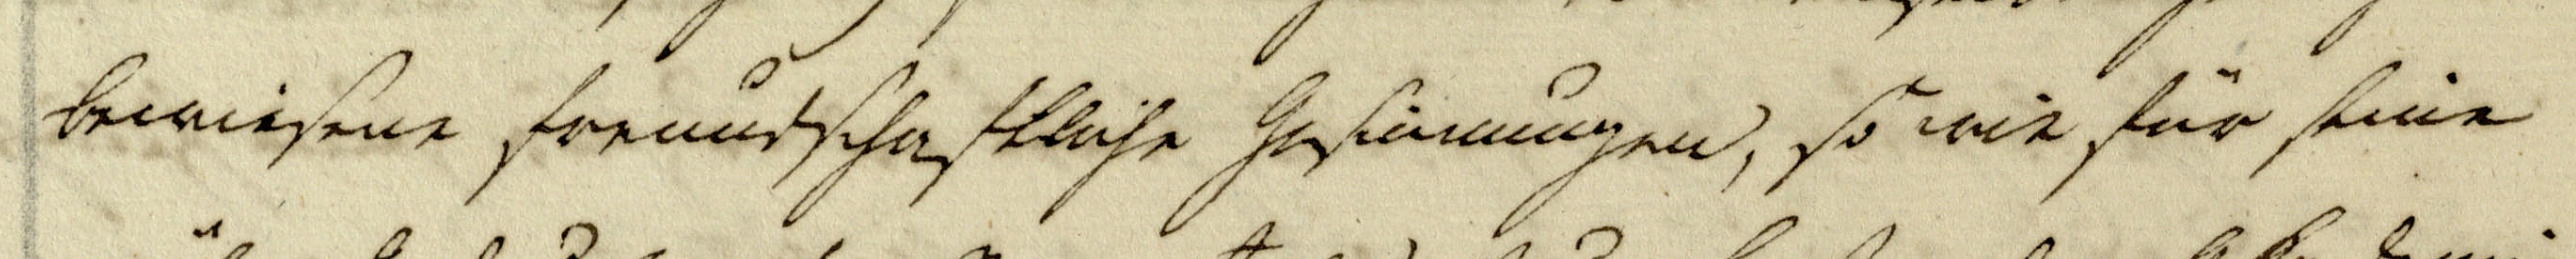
bewiesene freundschaftliche Gesinnungen, so wie für seine
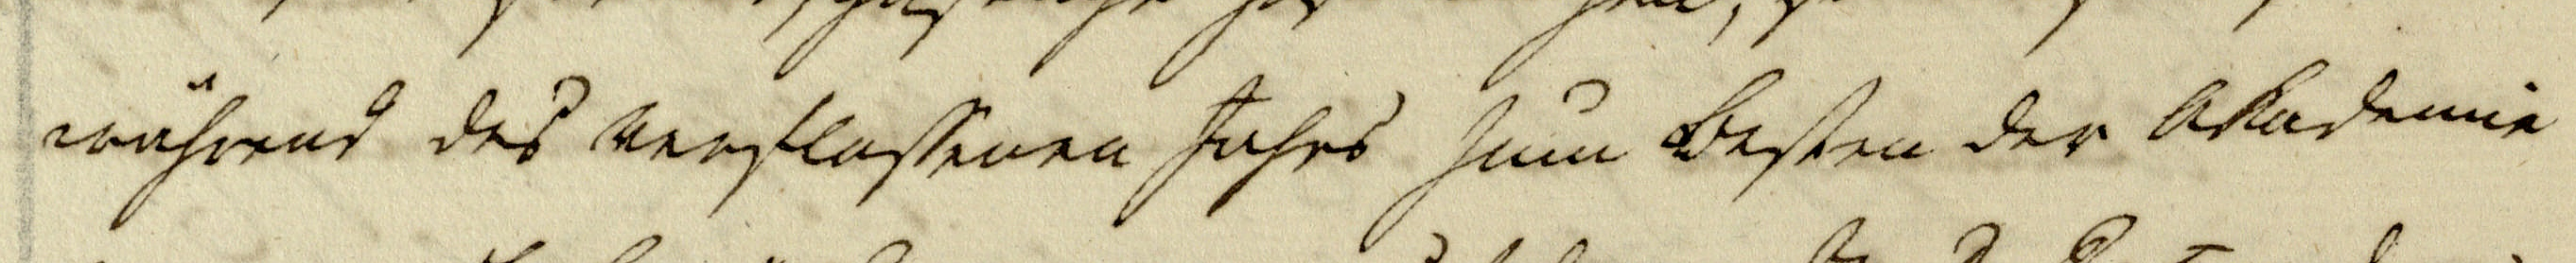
während des verflossenen Jahres zum Besten der Akademie
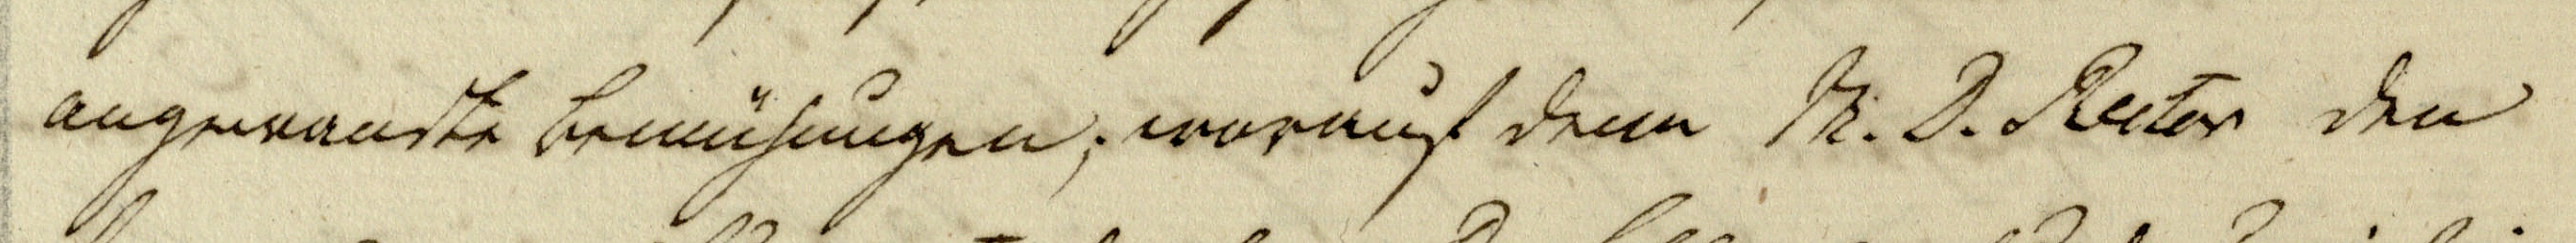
angewandte Bemühungen, worauf denn M. D. Rector. den
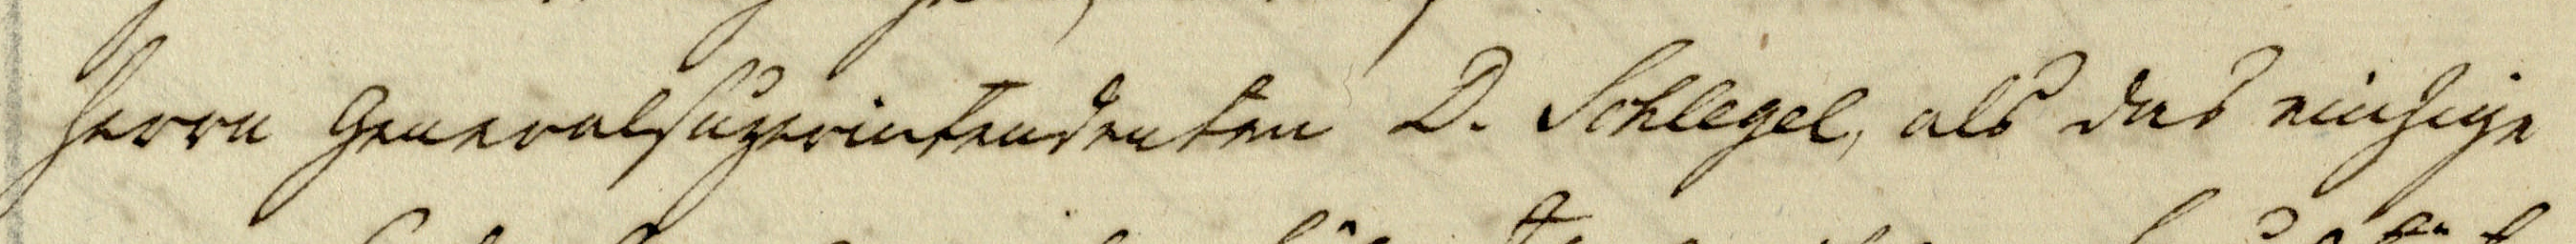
Herrn Generalsuperintendenten D. Schlegel, als das einzige
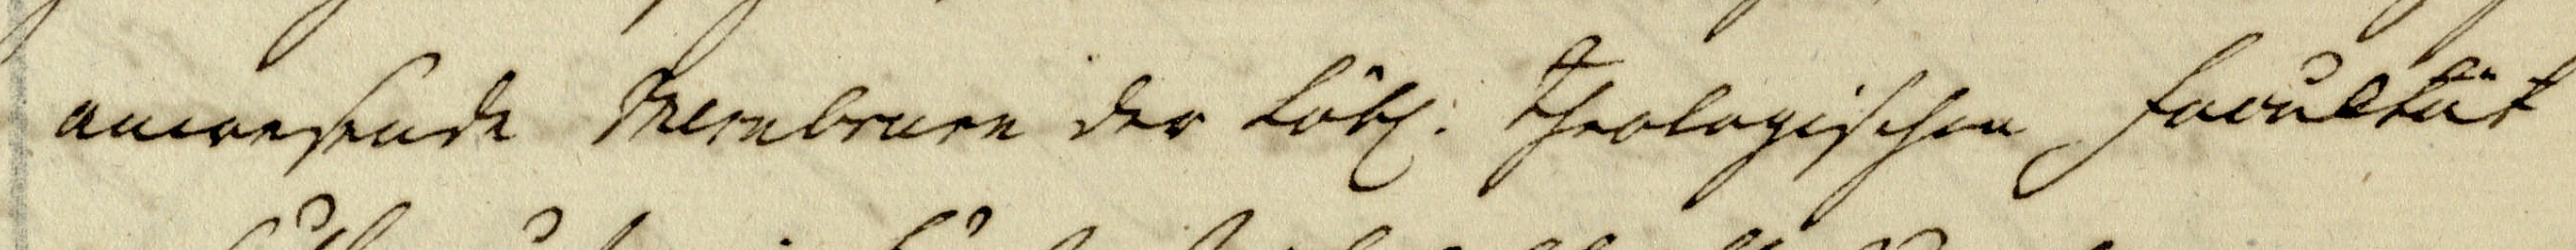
anwesende Membrum der Löbl. Theologischen Facultät
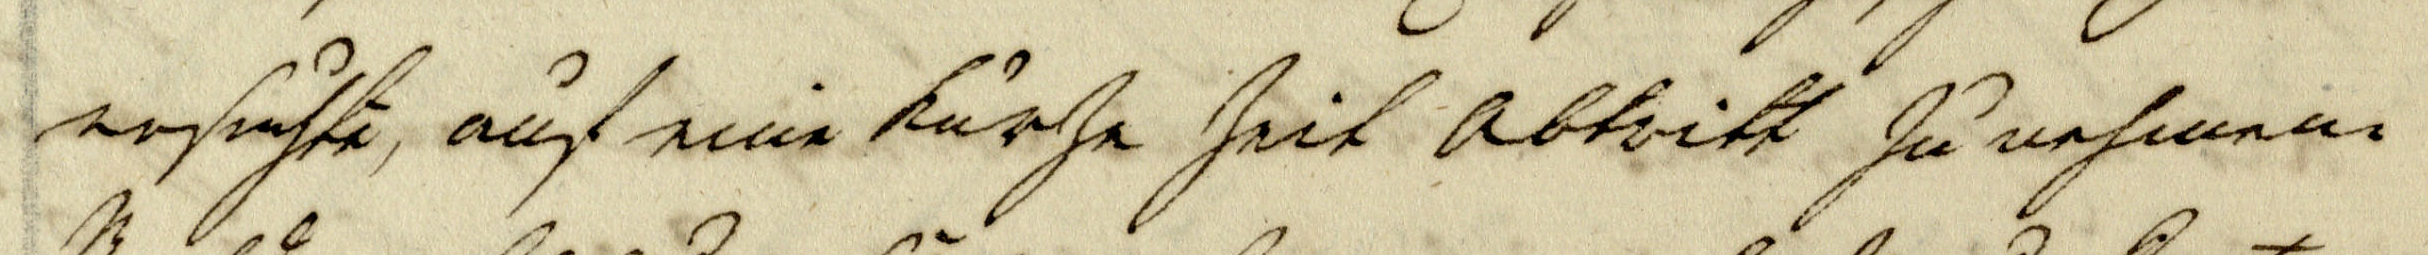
ersuchte, auf eine kurze Zeit Abtritt zu nehmen.
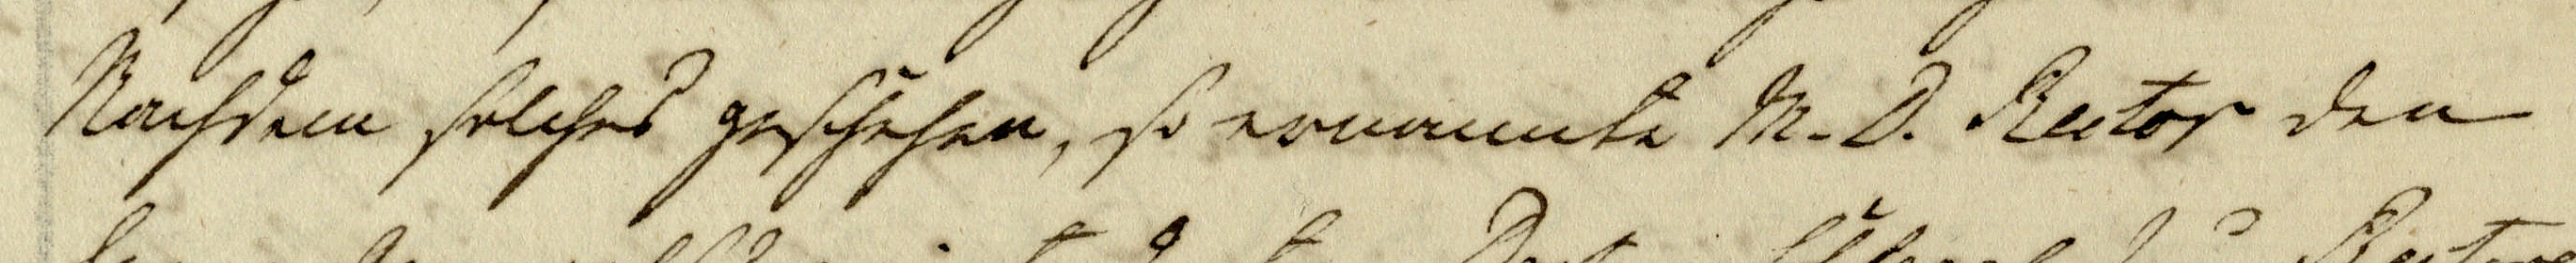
Nachdem solches geschehen, so ernannte M. D. Rector den
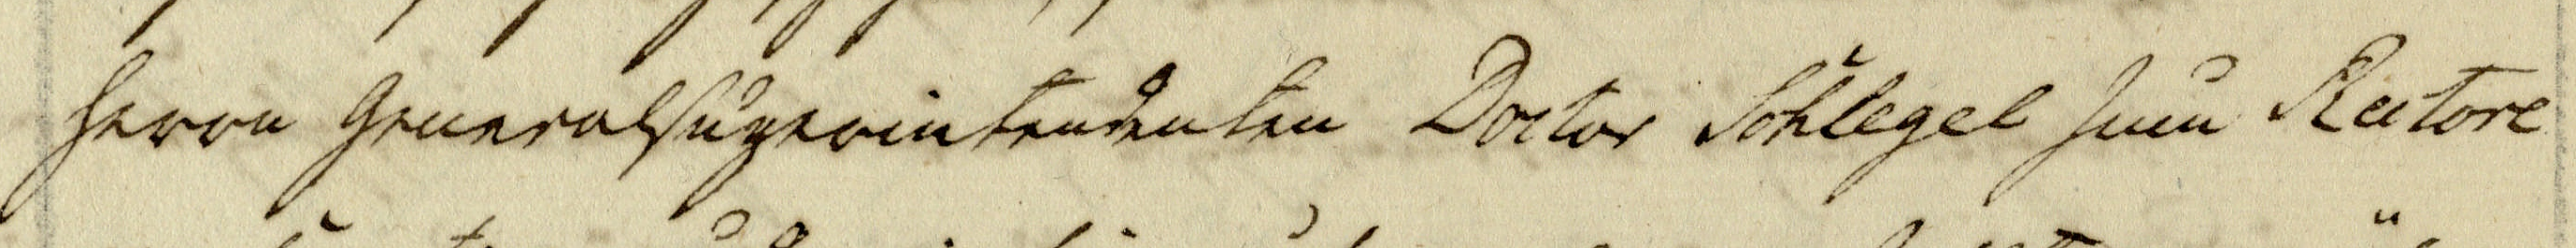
Herrn Generalsuperintendenten Doctor Schlegel zum Rectore
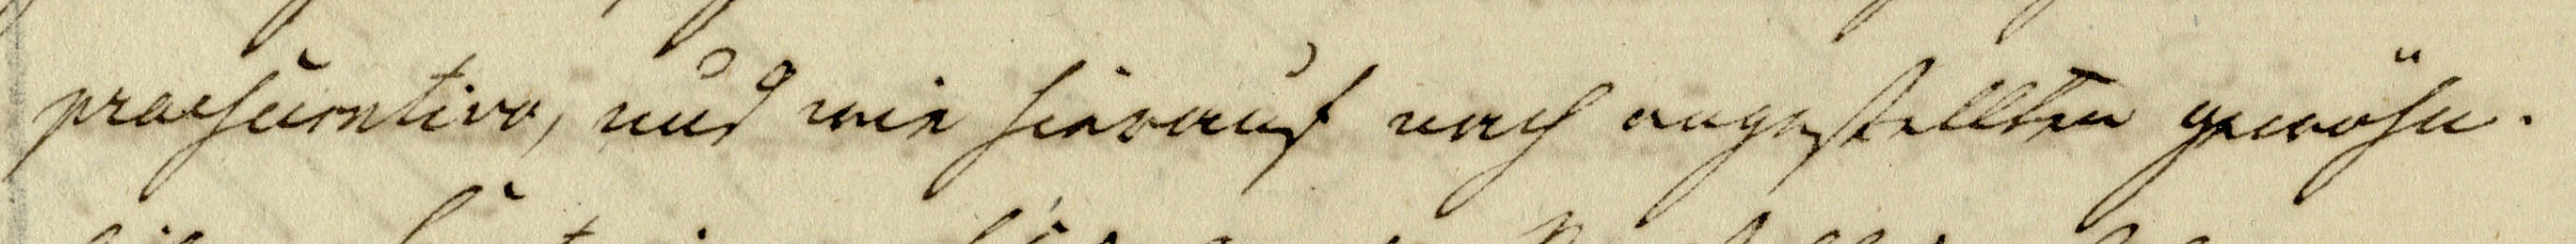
praesumtivo, und wie hierauf nach angestellten gewöhn
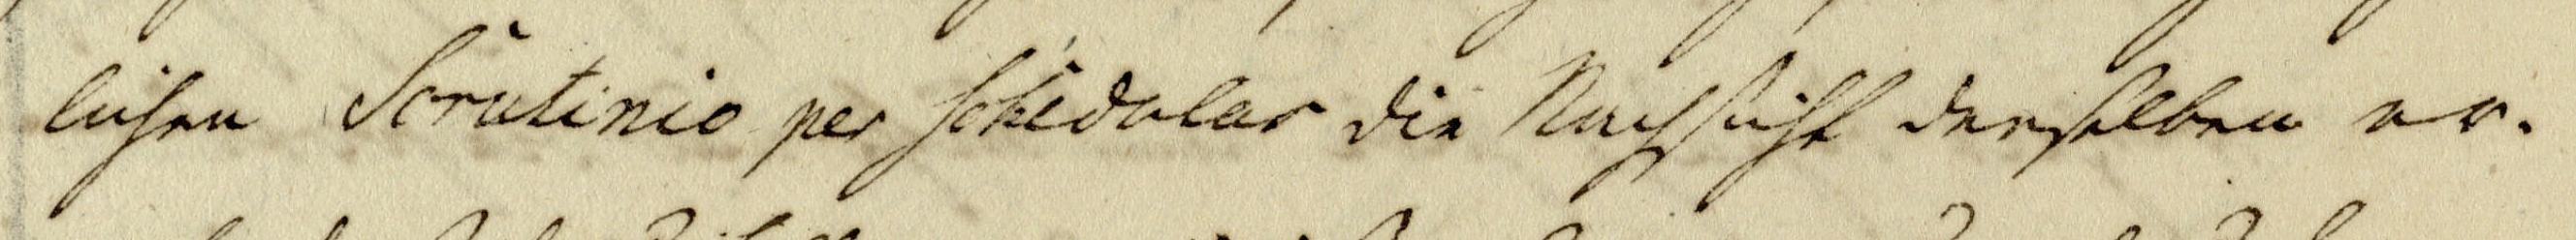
lichen Scrutinio per schedulas die Nachsicht derselben er¬
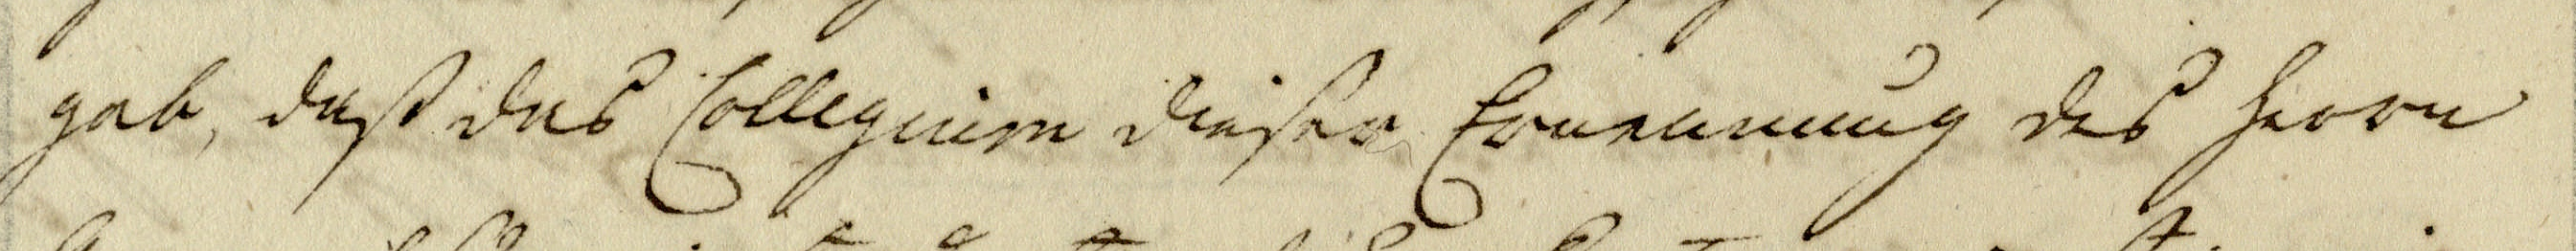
gab, daß das Collegium dieser Ernennung des Herrn
